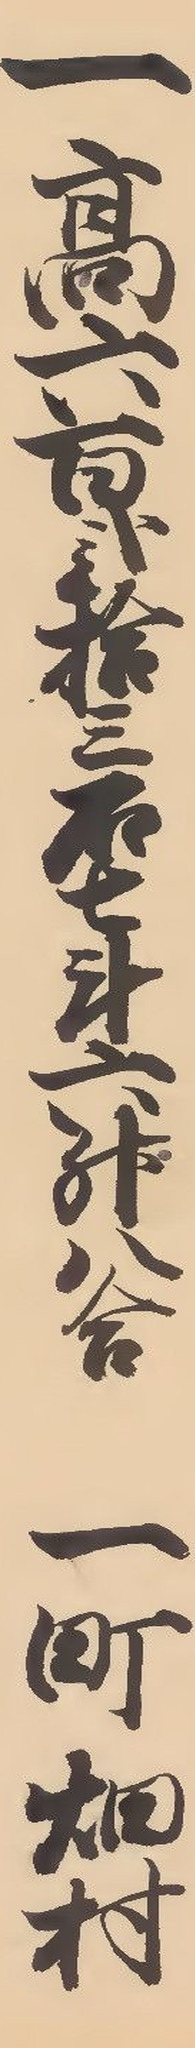一高六百弐拾三石七斗六升八合一町畑村
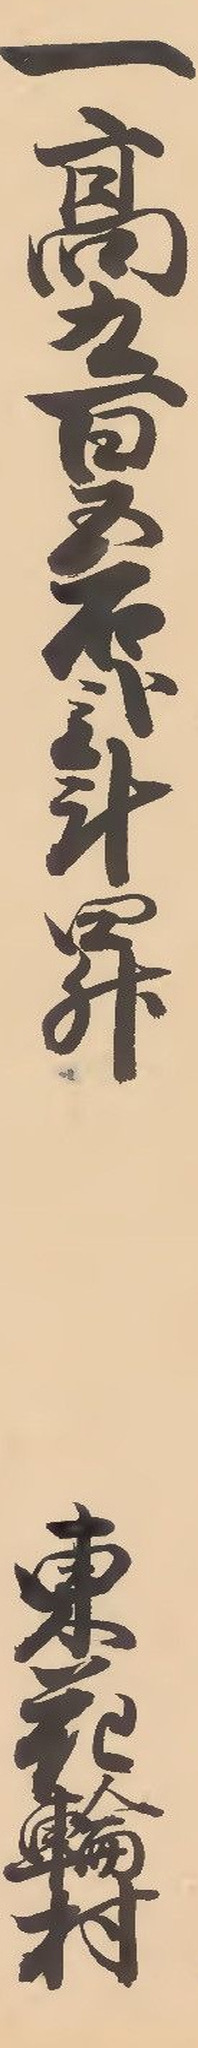一高九百五石弐斗四升東花輪村
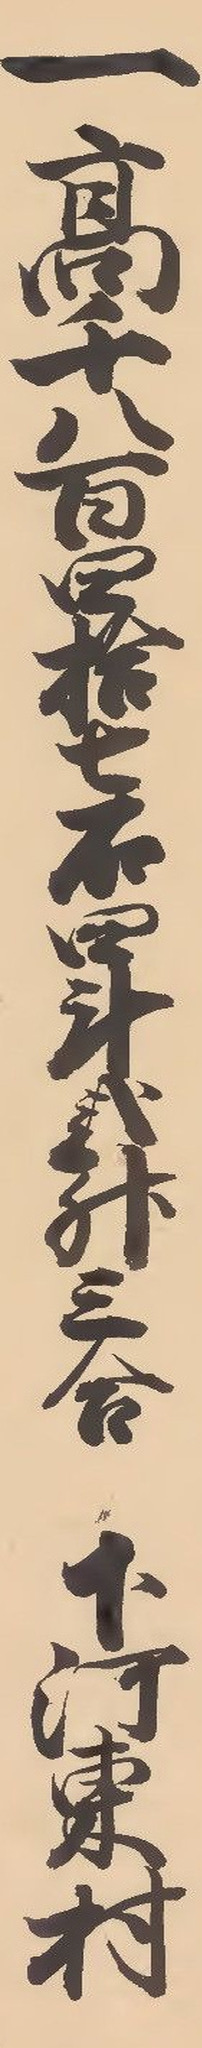一高千八百四拾七石四斗弐升三合下河東村
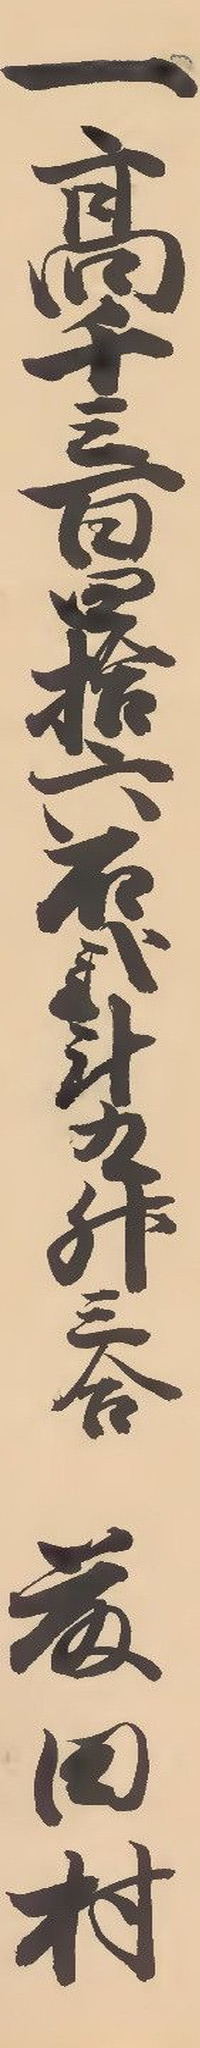一高千三百四拾六石弐斗九升三合藤田村
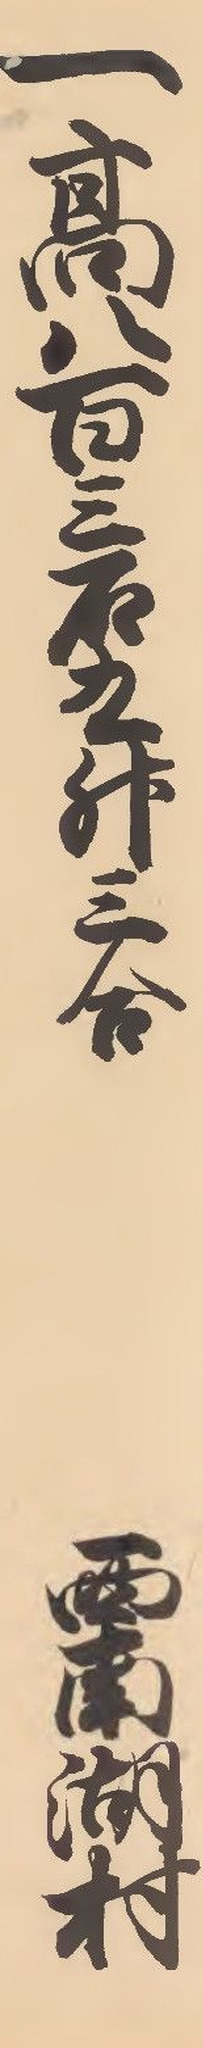一高八百三石九升三合西南湖村
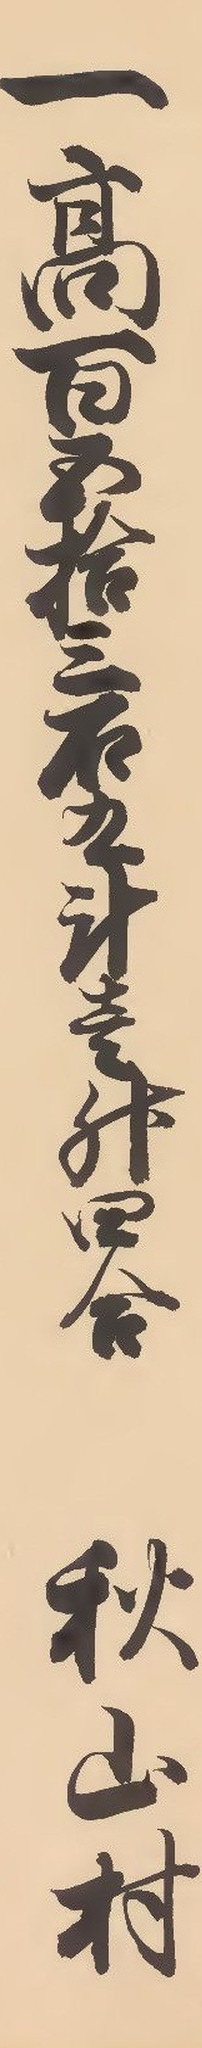一高百五拾三石九斗壱升四合秋山村
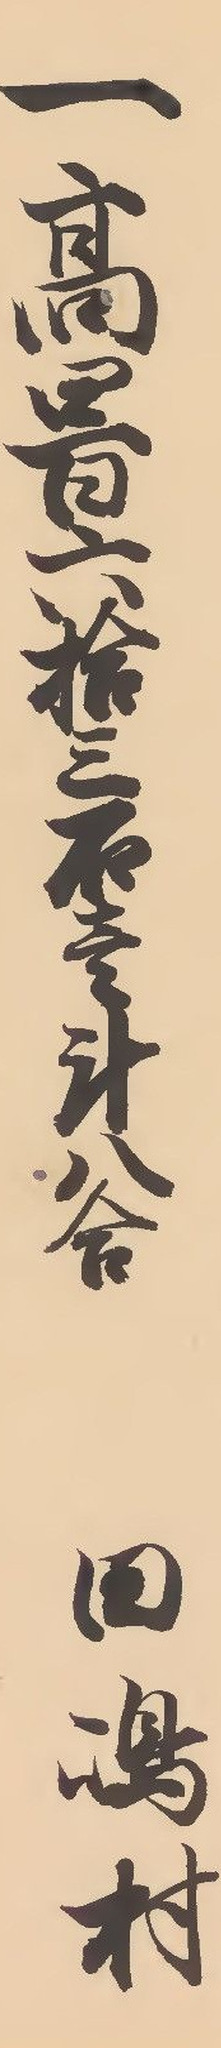一高四百六拾三石壱斗八合田島村

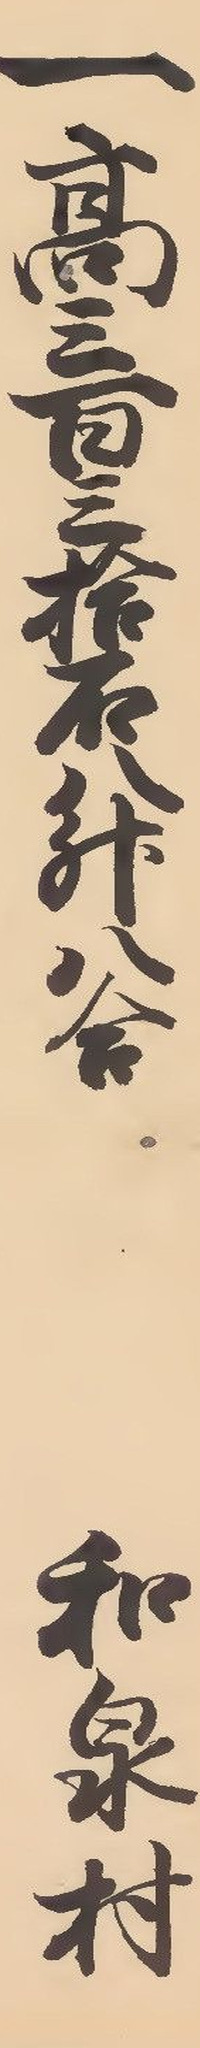一高三百三拾石八升八合和泉村
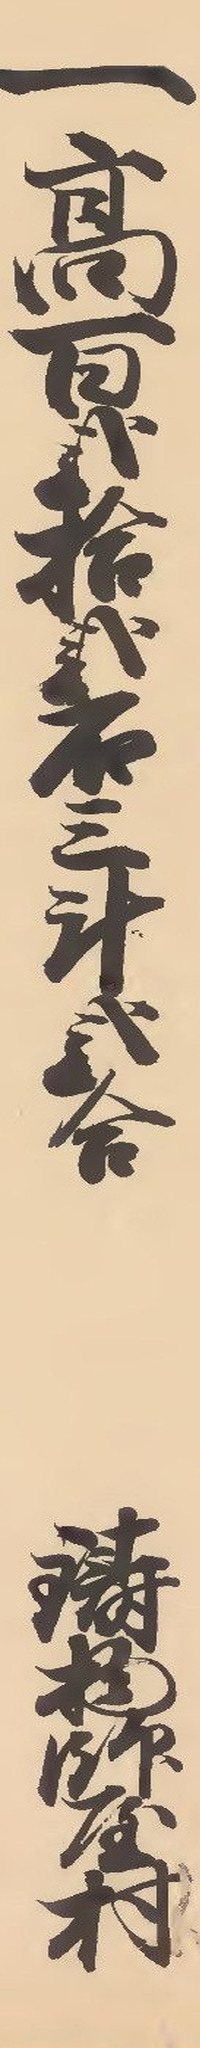一高百弐拾弐石三斗弐合鋳物師屋村
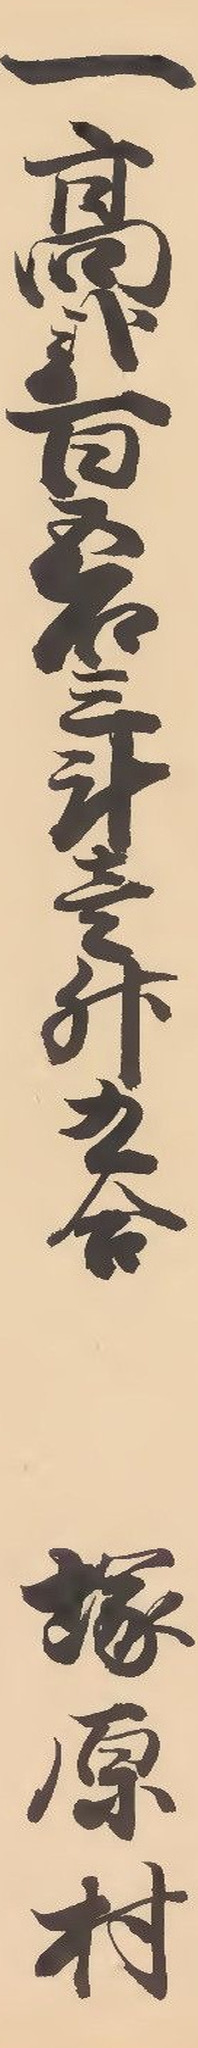一高弐百五石三斗壱升九合塚原村
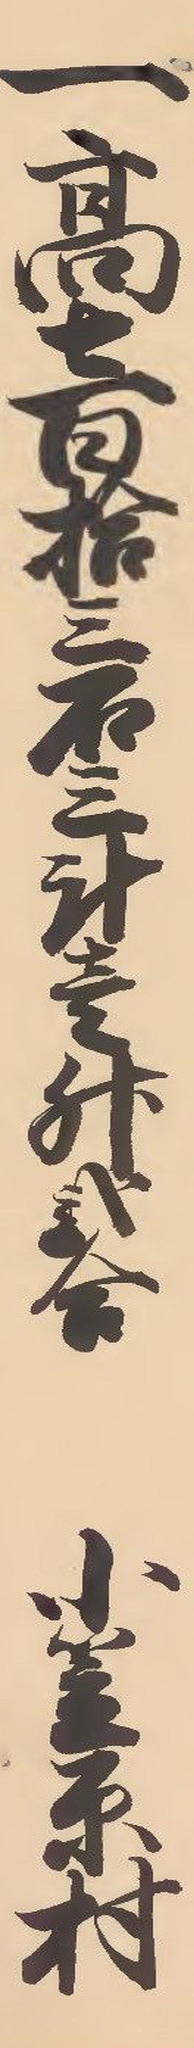一高七百拾三石三斗壱升弐合小笠原村
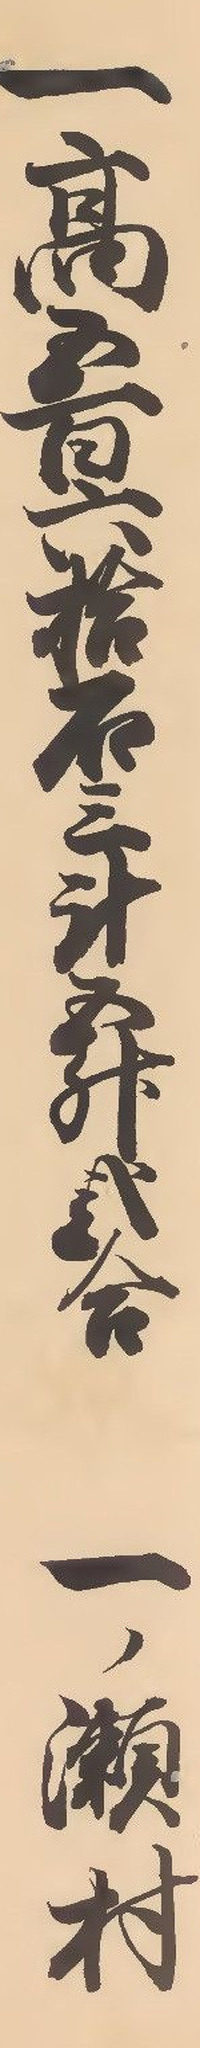一高五百六拾石三斗五升弐合一ノ瀬村
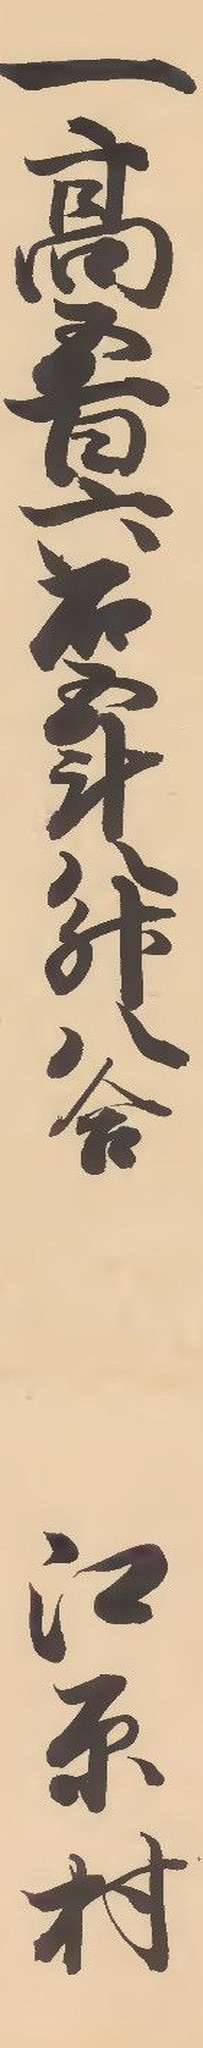一高五百六石五斗八升八合江原村
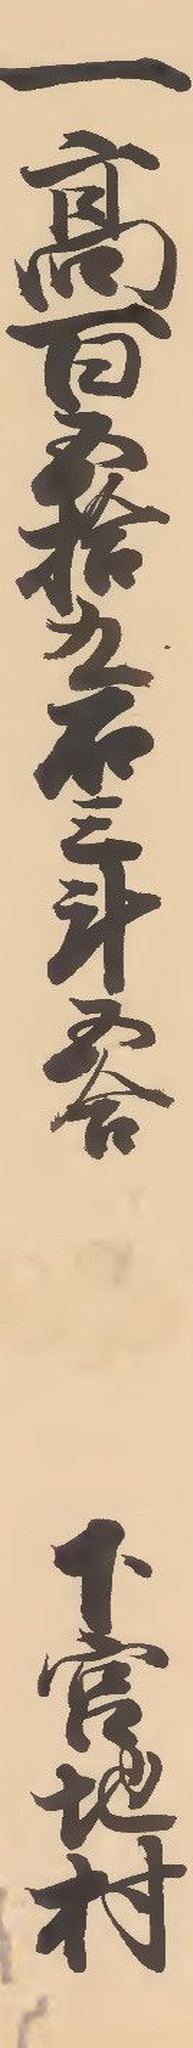一高百五拾九石三斗五合下宮地村
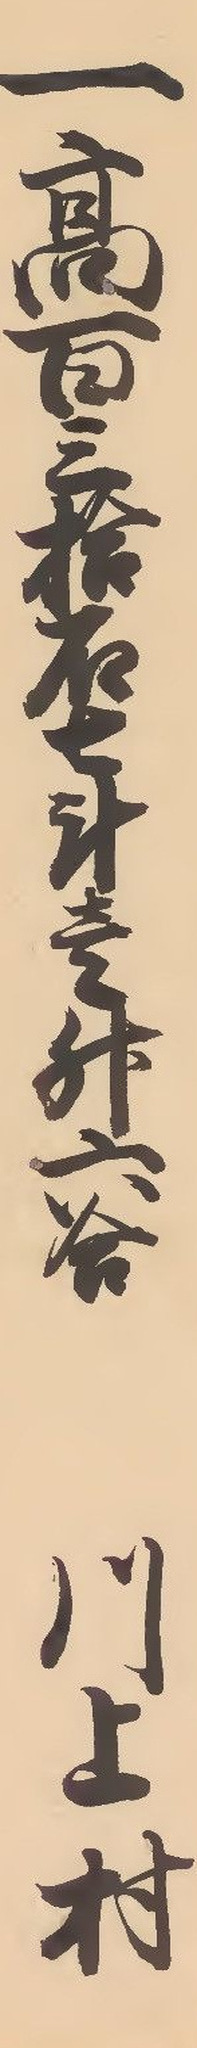一高百三拾石七斗壱升六合川上村

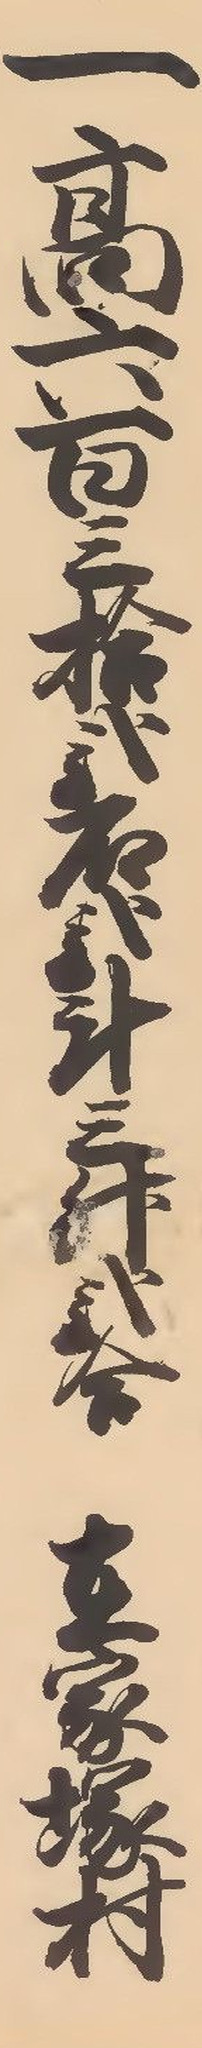一高六百三拾弐石弐斗三升弐合在家塚村
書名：甲斐国郷帳
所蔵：国立公文書館 National Archives of Japan
